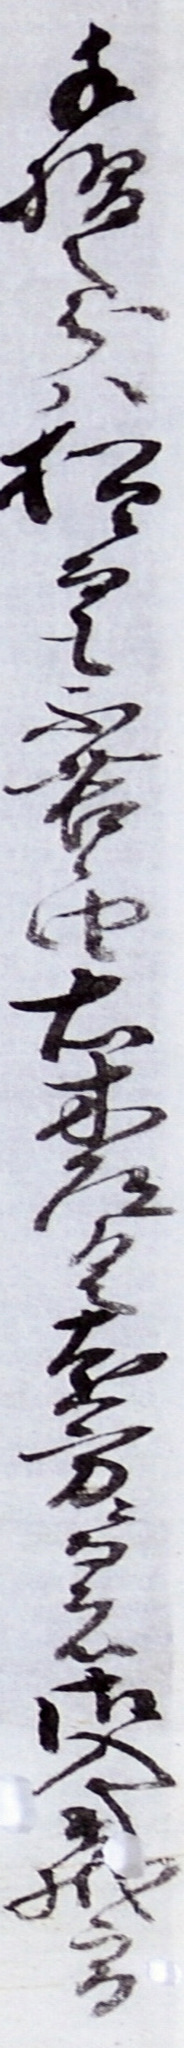手摺之分ハ松ニ而も不苦候由右木道具遠方ニ而は御入用掛高
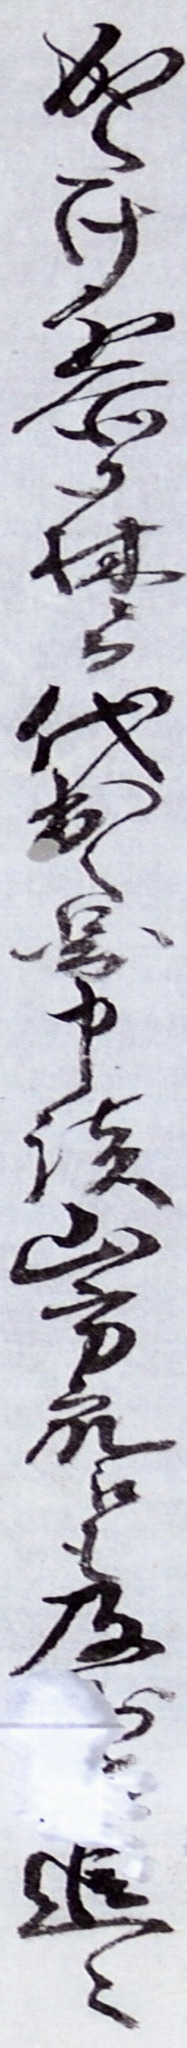成たけ遠所御林ニ而伐出之図申談山方衆江も及追々
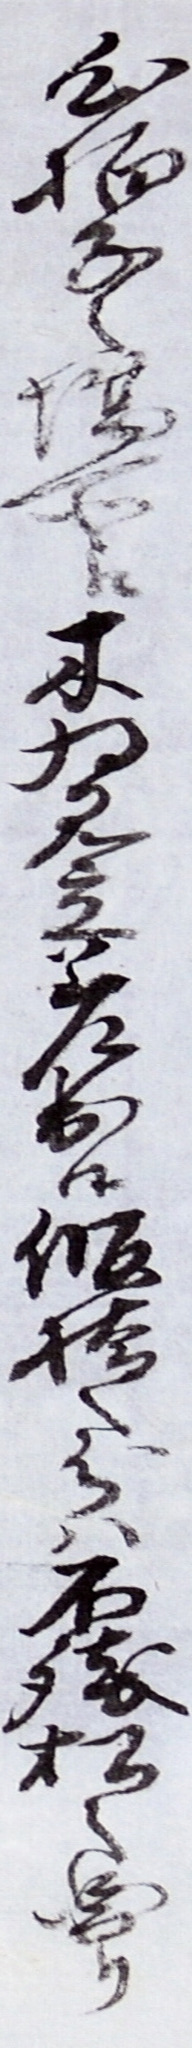心之場所江木為見立差出候仮橋之分ハ不残松之図り
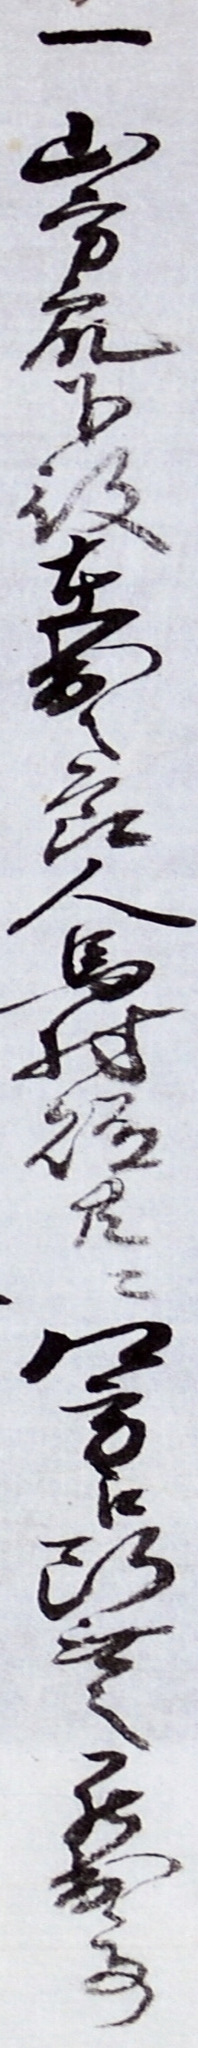一山方衆下役在出之節人馬村賄共ニ郷方江断無之罷出候事
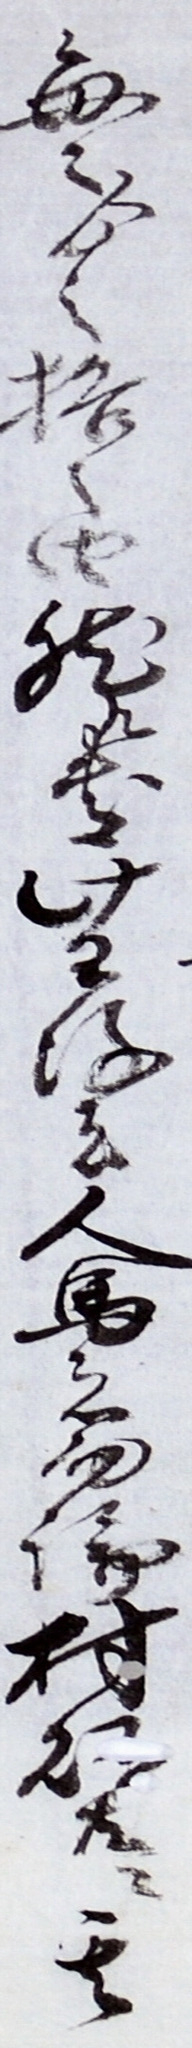毎々ゟ之格之由然ル処此已後は人馬は勿論村賄共ニ其
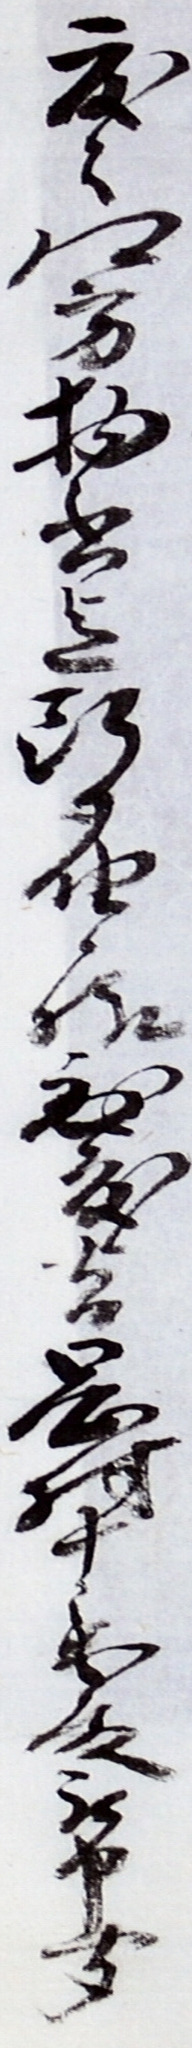度々郷方物書迄断御届候様到度旨岡村十兵衛殿被申聞
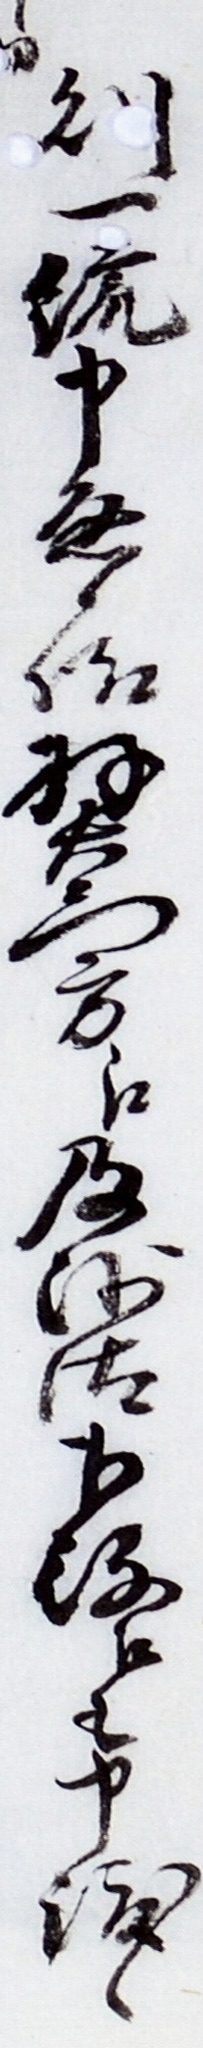則一統申通候様羽右衛門方江及沙汰下役江も申渡候
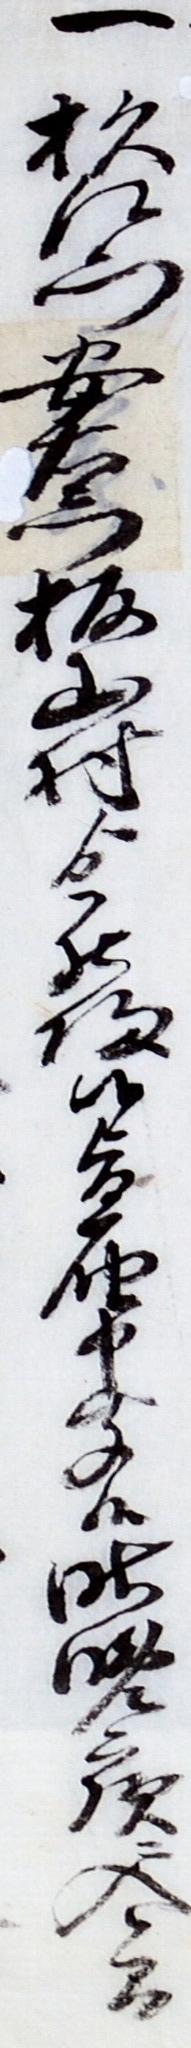一杉左衛門安右衛門板山村ゟ罷帰候旨届申聞候昨晩夜ニ入候間
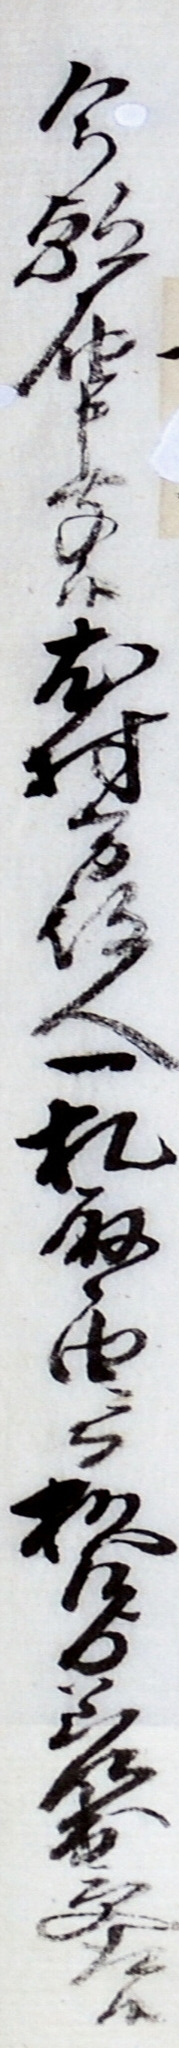今朝届申聞候尤村方役人一札取候由ニ而杉左衛門差出受取候
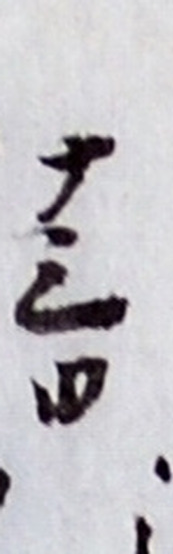十三日
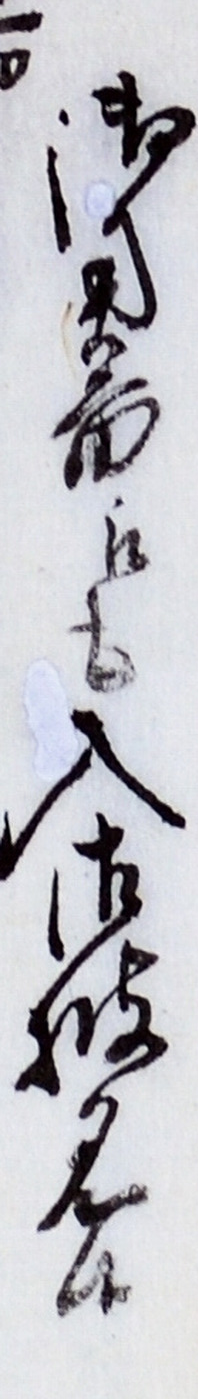御用番江も入御披見候
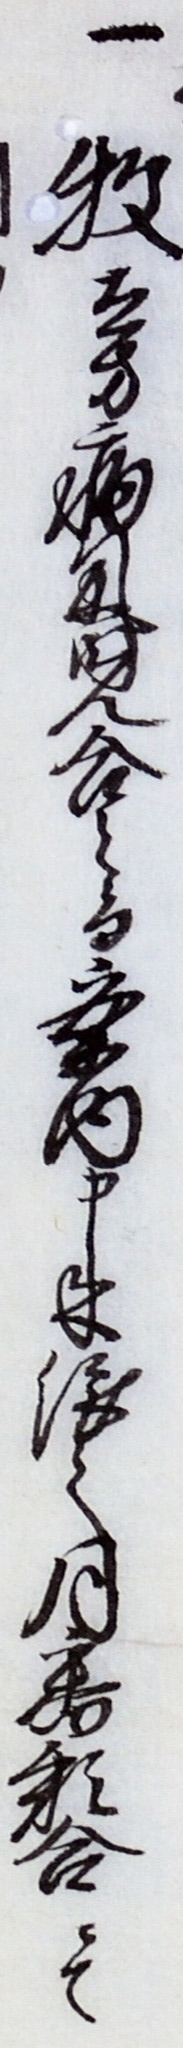一牧太方病気見合之旨案内申来依之月番頼合ニて
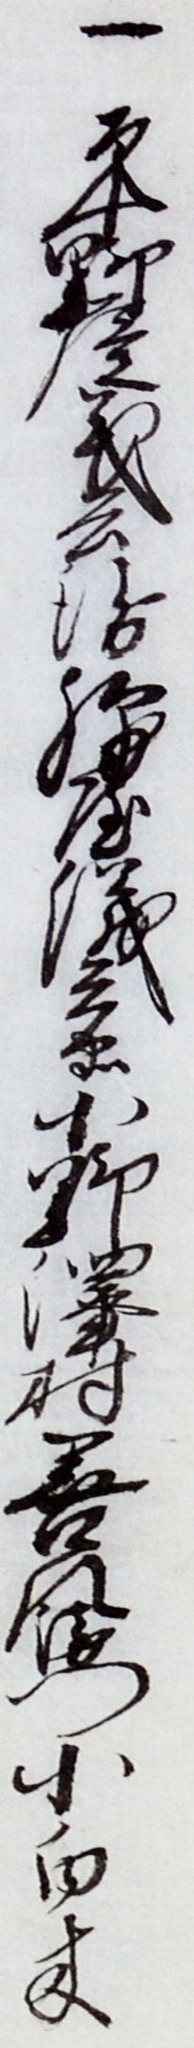一平野屋義兵衛治綿屋儀兵衛小野沢村善左衛門小白木
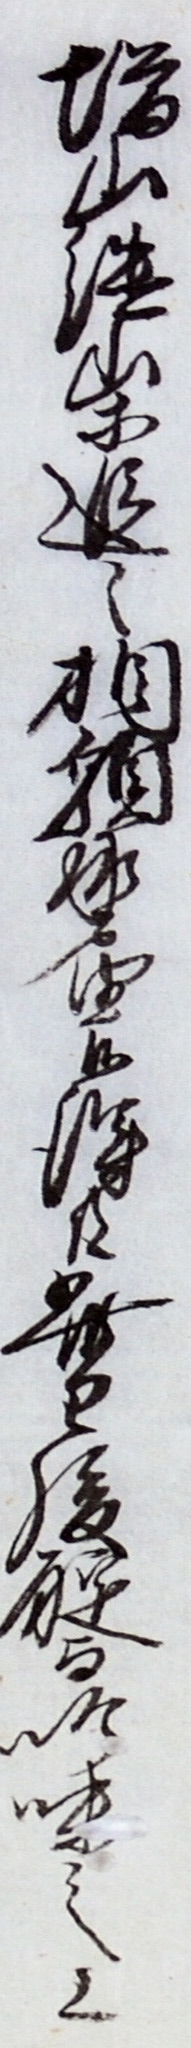増山継山等追々願御届得共此已後聢と吟味之上
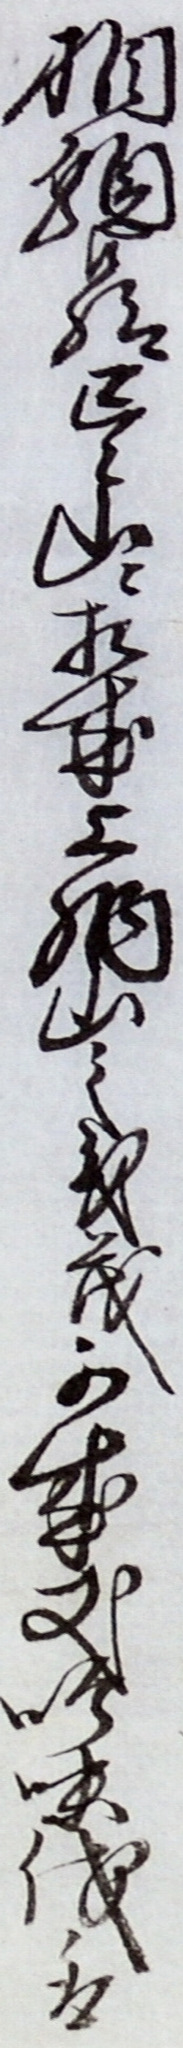相願候様已上山ニ相成上納山之義も可成丈吟味伐取
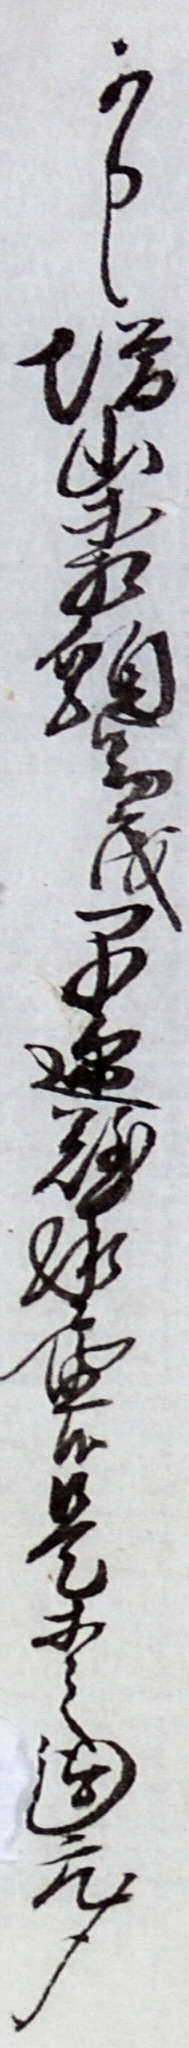可申候増山等相願候而も早速難承届候是等之趣元〆
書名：御山奉行御用控
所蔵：伊那市立高遠町図書館・合同会社AMANE
